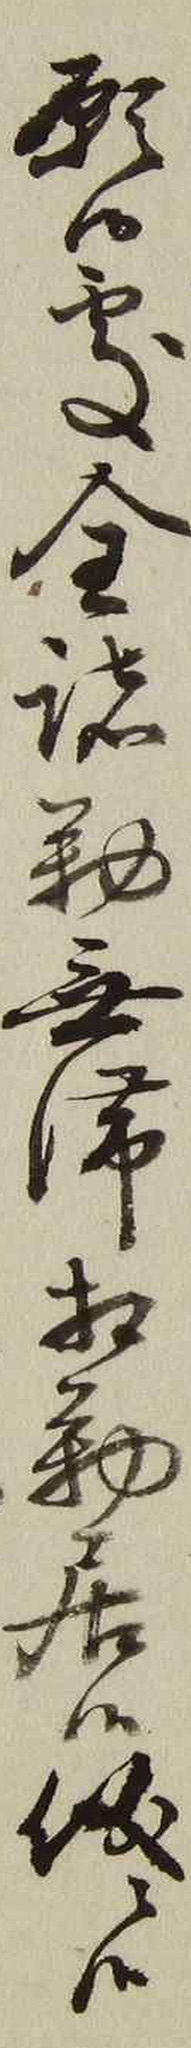願候処全諸勤無滞相勤居候儀ニ候
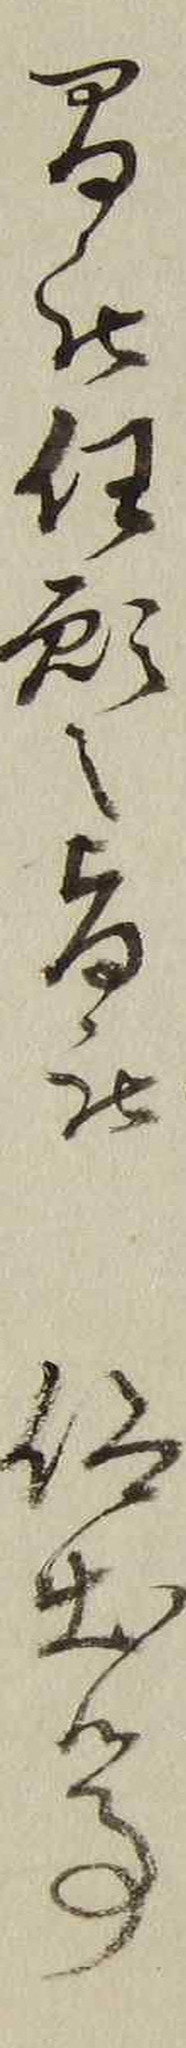間被任願之旨被仰出候事
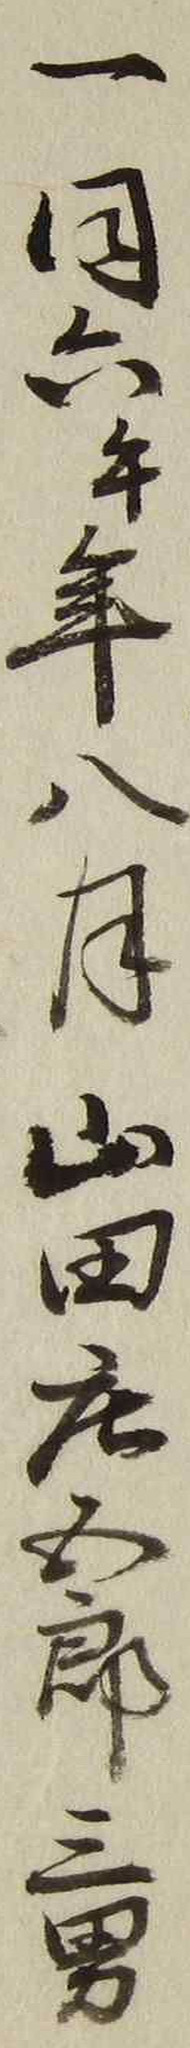一同六午年八月山田庄五郎三男
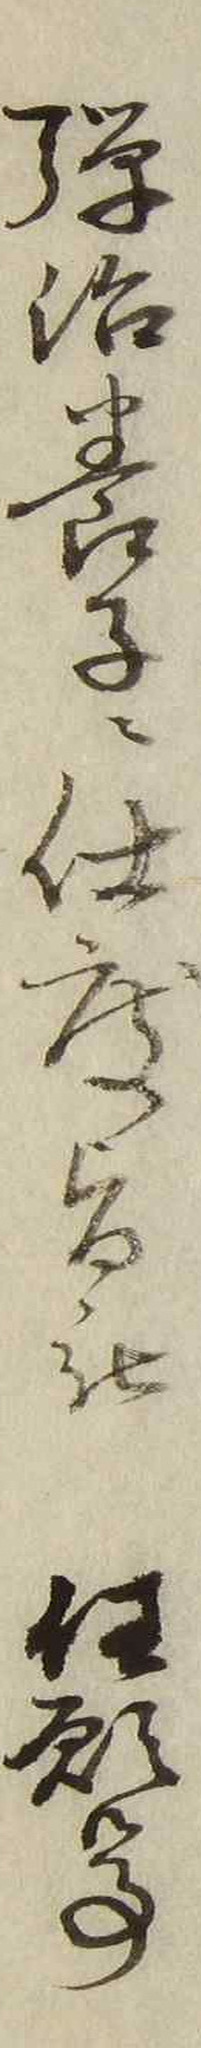弾治養子ニ仕度旨被住願候事

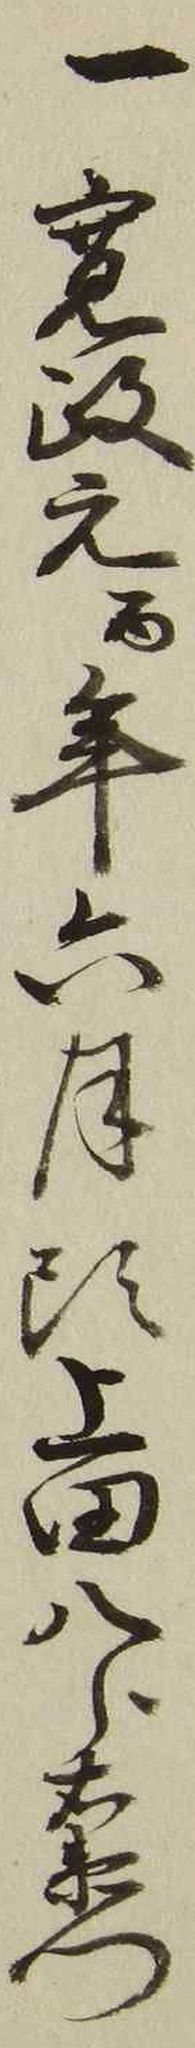一寛政元酉年六月頭上田八郎衛門
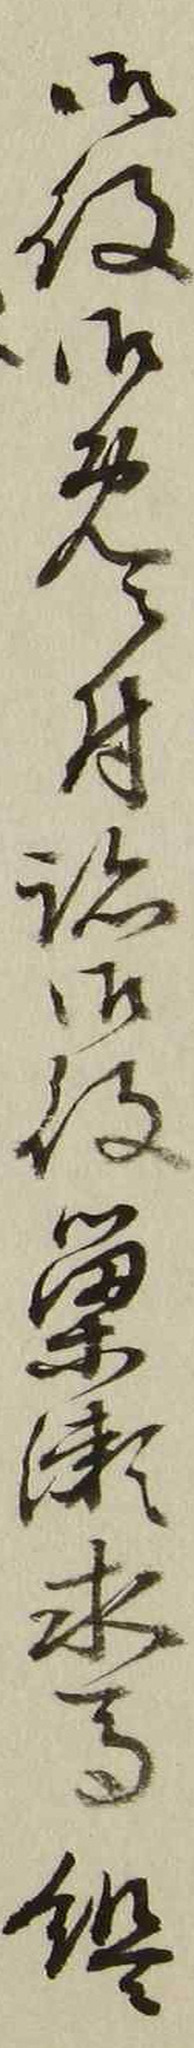御役御免ニ付跡御役簗瀬求馬組ニ
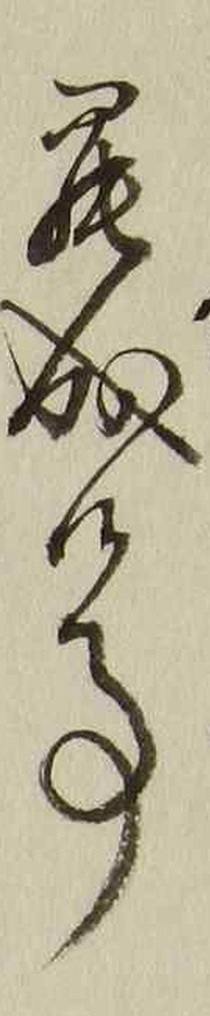罷成候事
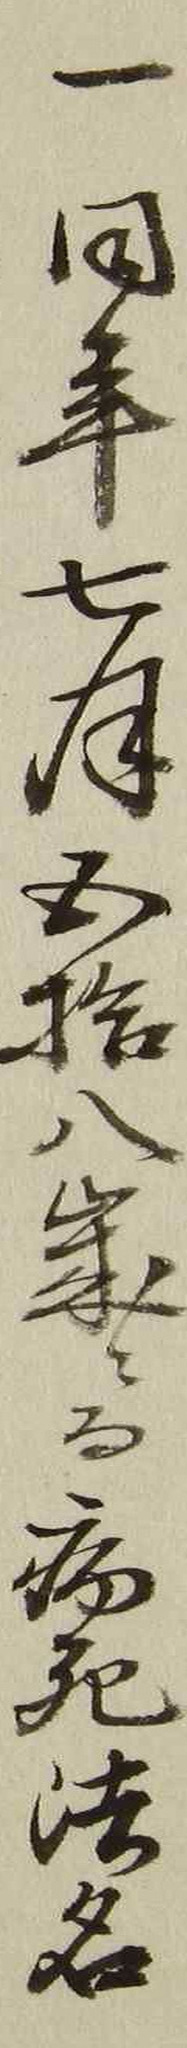一同年七月五拾八歳ニ而病死法名
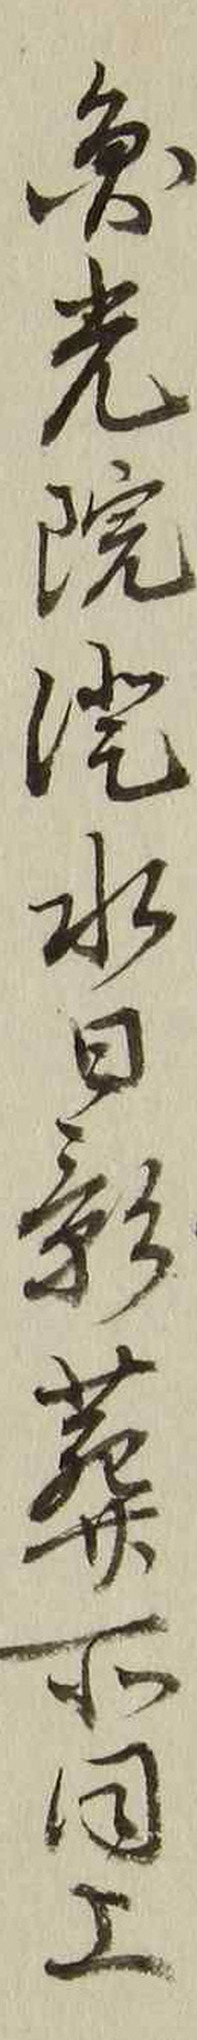円光院澄水日影葬所同上
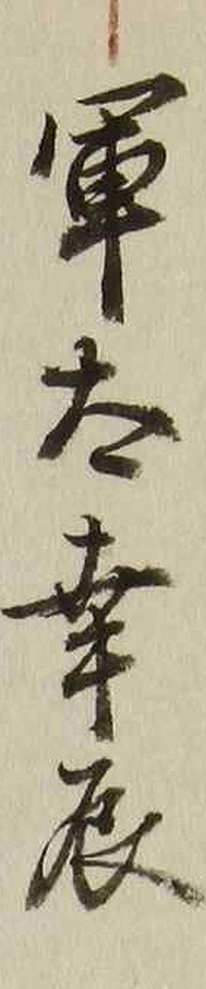軍太幸辰
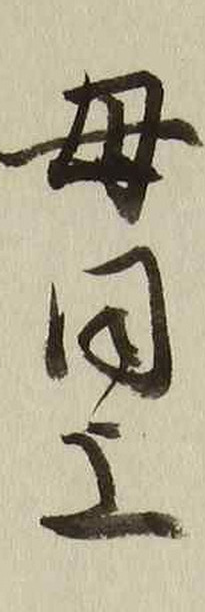母同上
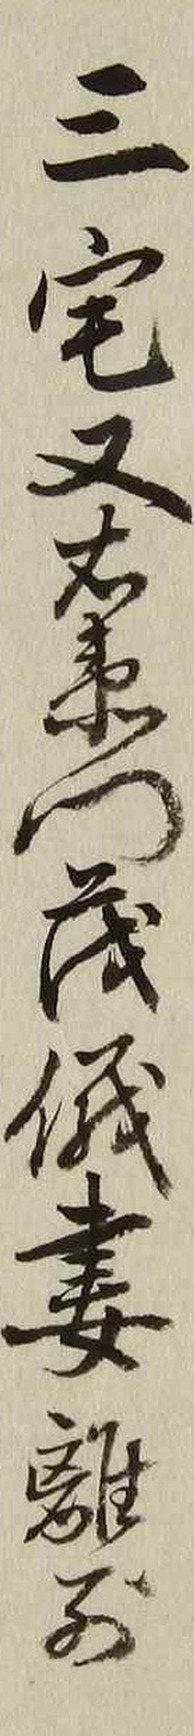三宅又右衛門茂儀妻離別
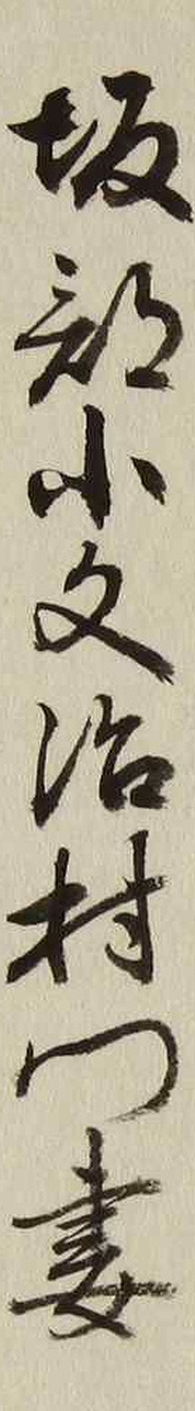坂部小文治村門妻
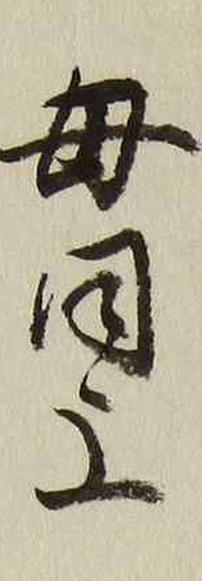母同上
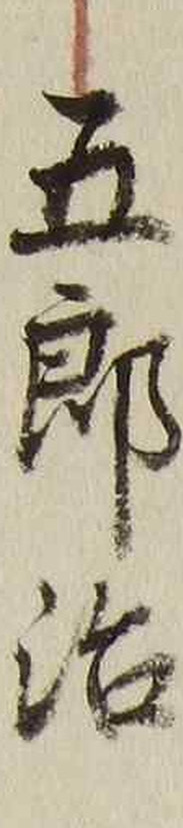五郎治

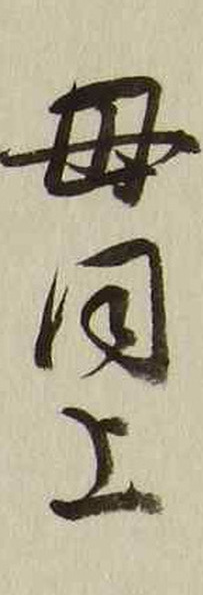母同上
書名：諸士系譜　巻之35　は之部3
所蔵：会津若松市立会津図書館
